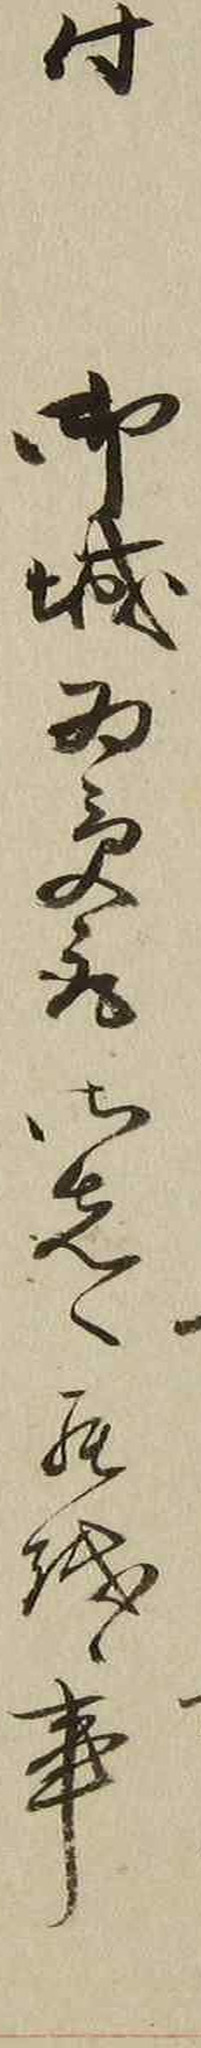付御城為受取御先へ罷越候事
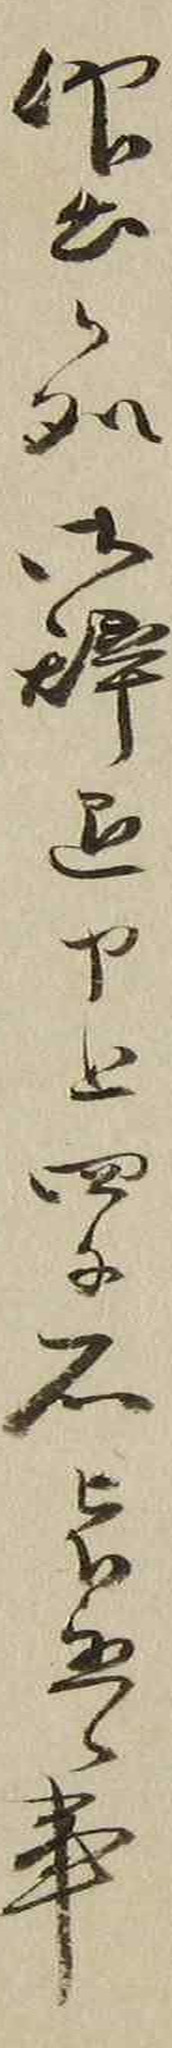仰出候処御辞退申上四千石被下置候事
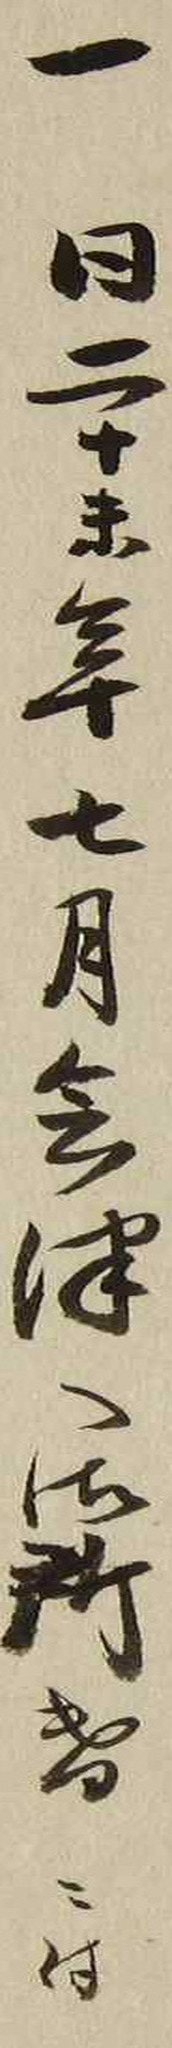一同二十未年七月会津へ御所替に付
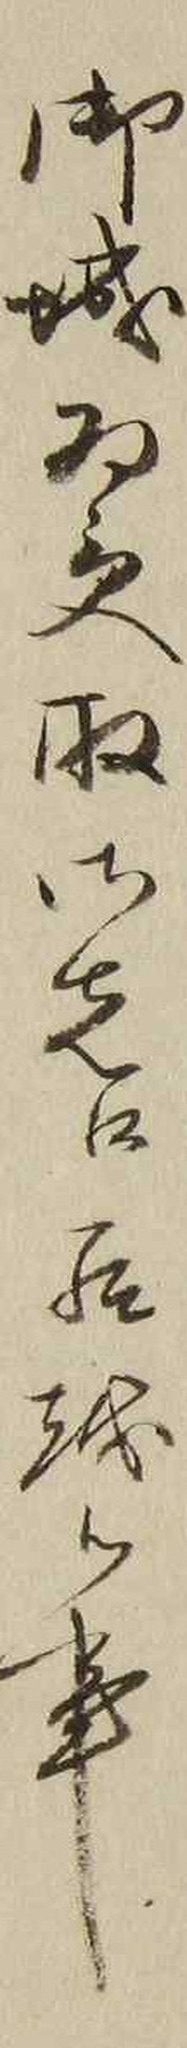御城為受取御先江罷越候事
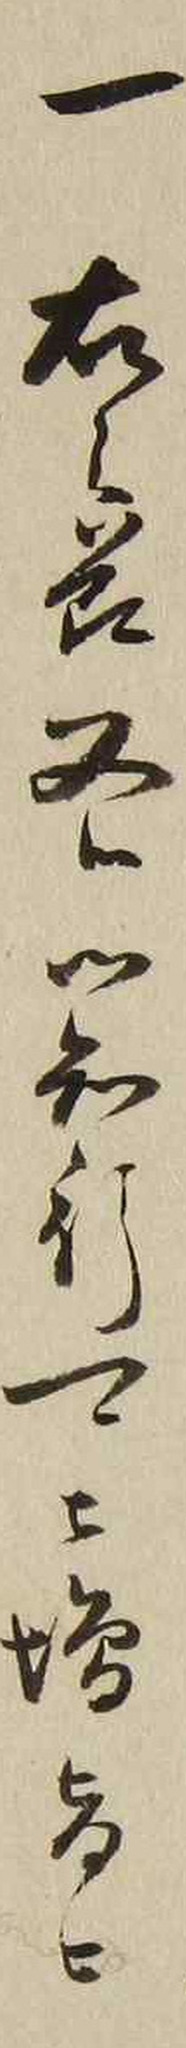一右之節又々御知行可被増旨被
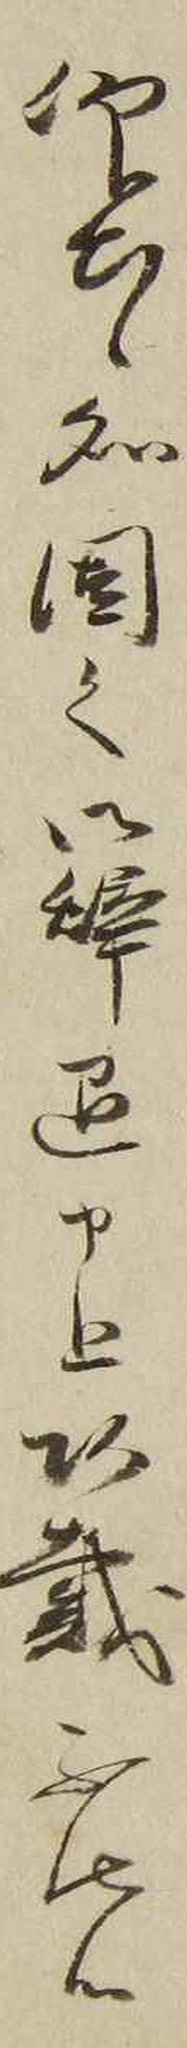仰出候処固く御辞退申上頂戴不仕候

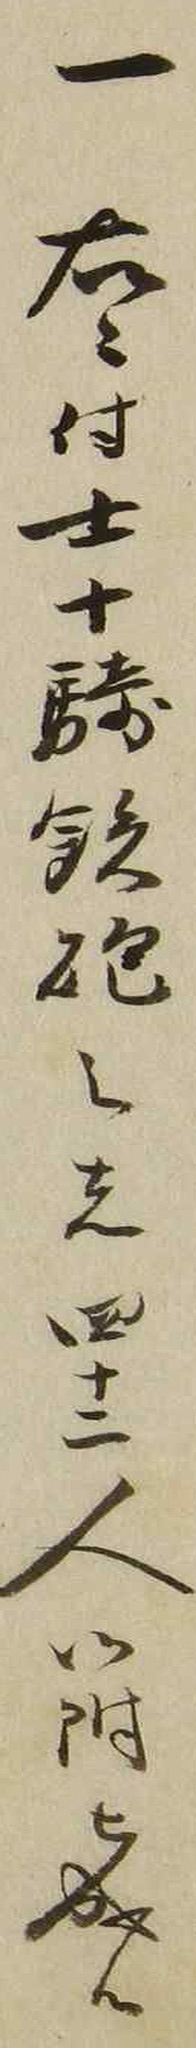一右に付士十騎鉄砲之者四十二人御付附被成候
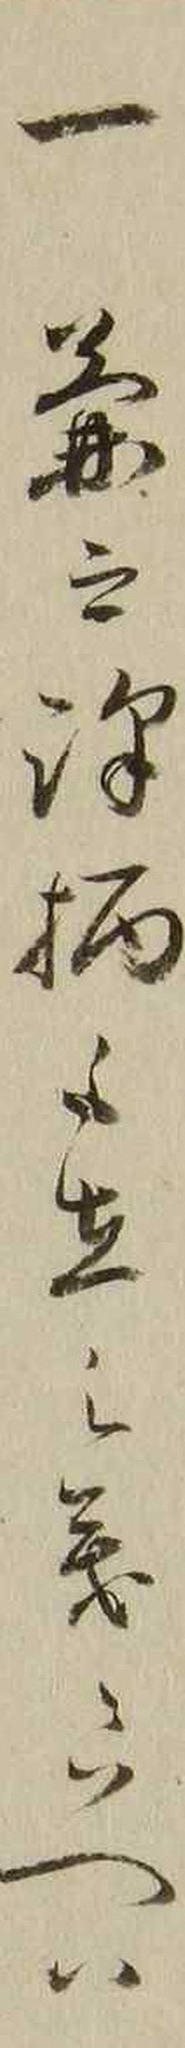一兼而譯柄も在之義に候へは
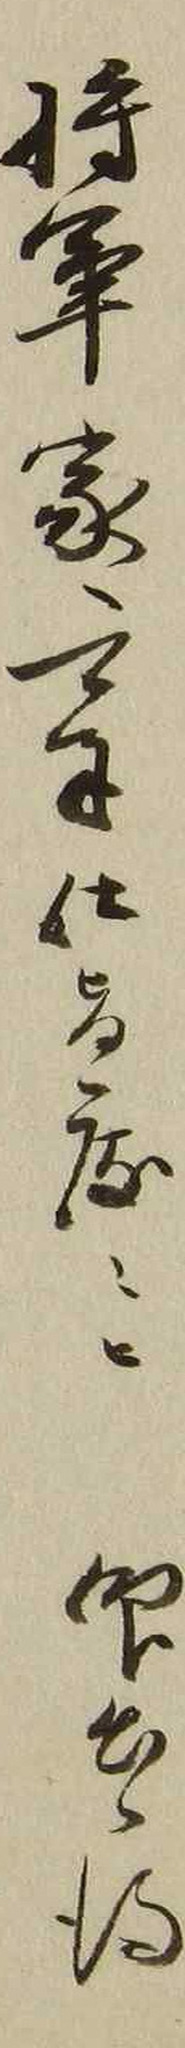将軍家へ可奉仕旨度々被仰出候得
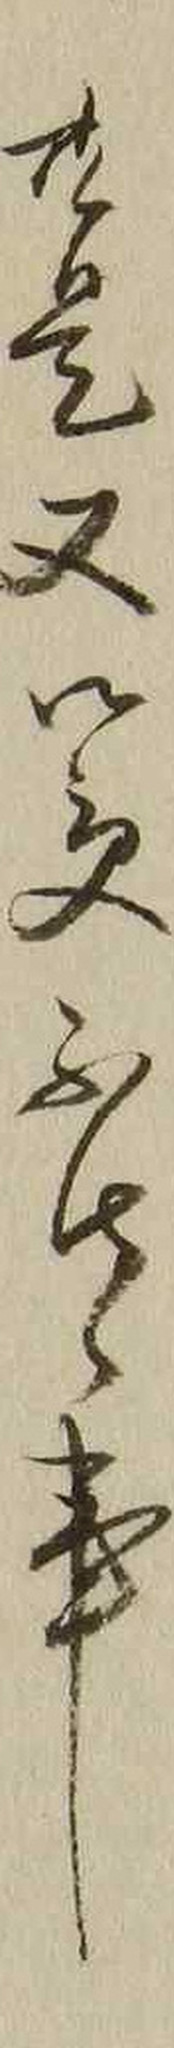共是又御受不仕候事
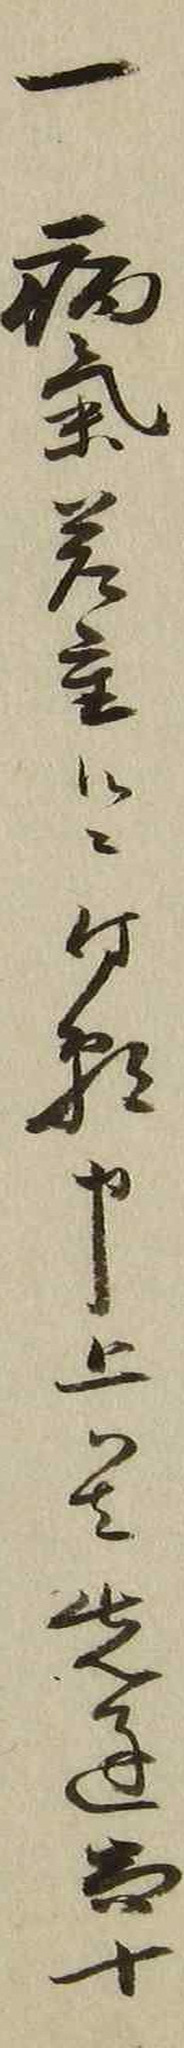一病気差重候に付願申上候は先達而十
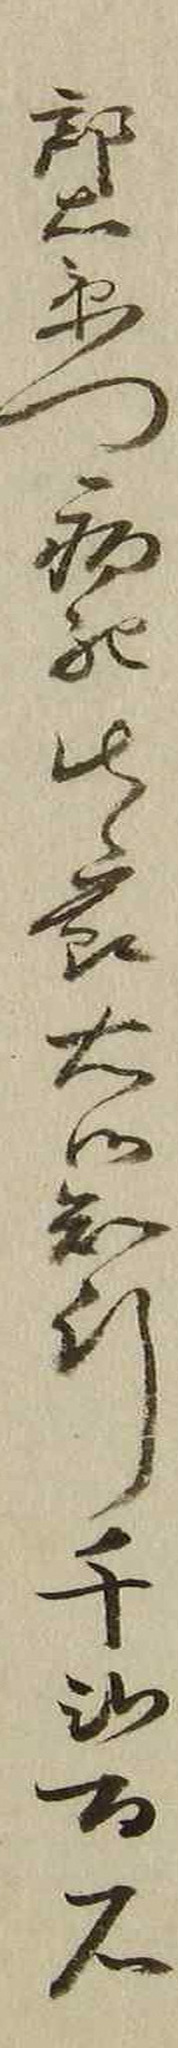郎右衛門病死仕候節右知行千弐百石
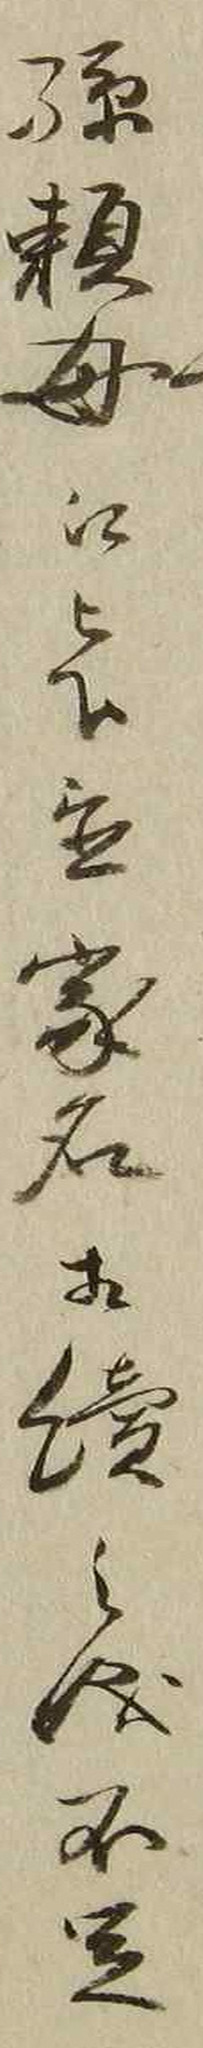孫賴母江被下置家名相続之儀不足
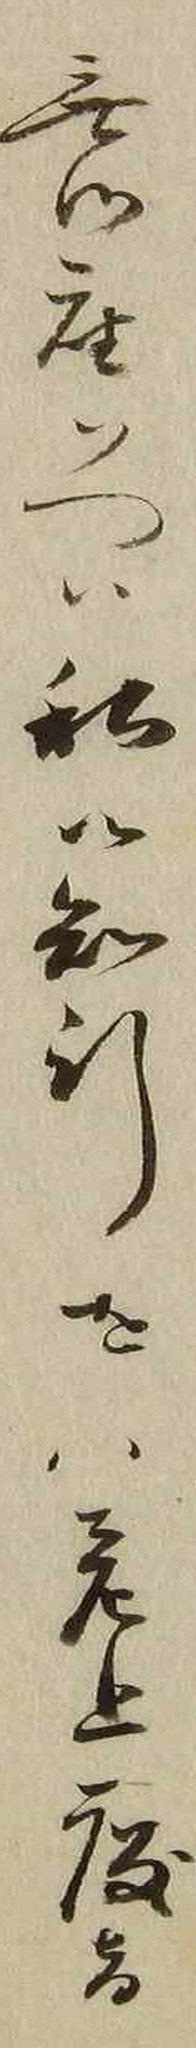無御座候へは私は知行義は差上度旨
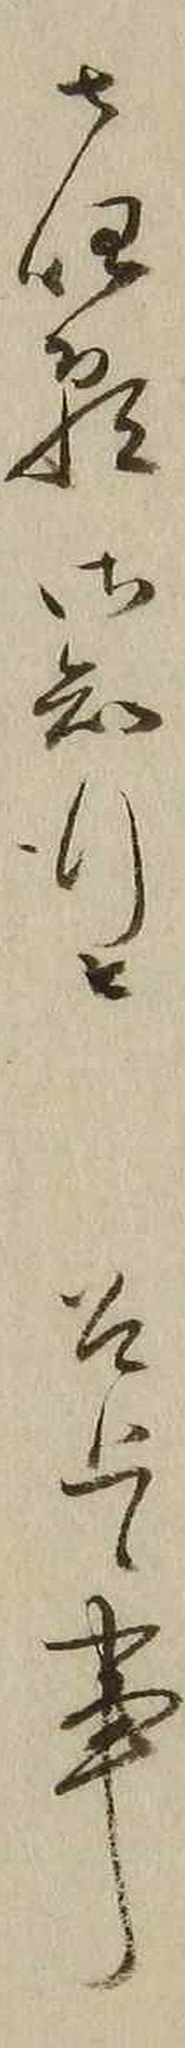は任願御知行被召上候事
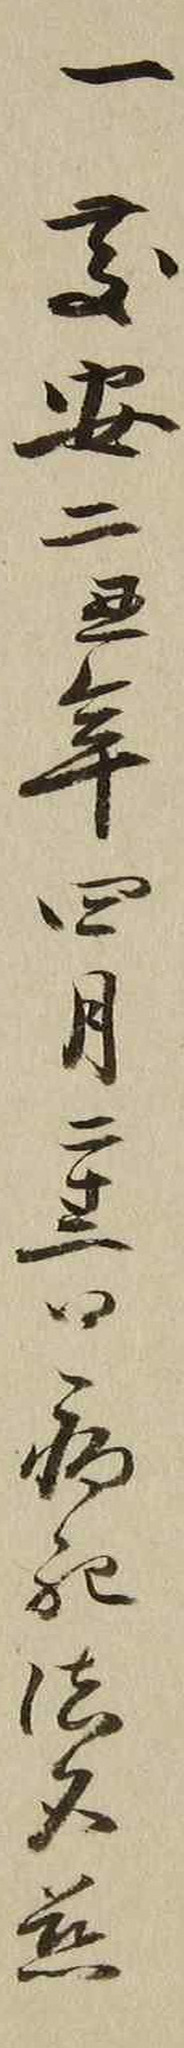一慶安二丑年四月二十二日病死法名慈
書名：諸士系譜　巻之269　さ之部1
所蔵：会津若松市立会津図書館
